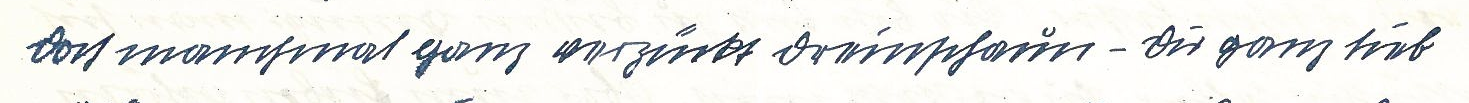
doch manchmal ganz verzückt dreinschaun – Dir ganz lieb
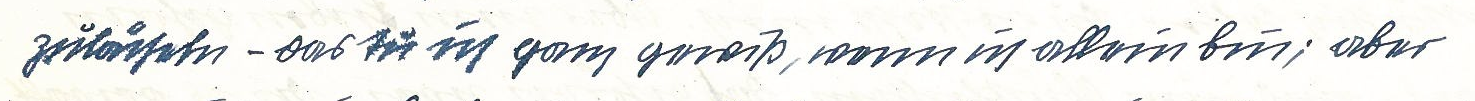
zulächeln – das tu ich ganz gewiß, wenn ich allein bin; aber
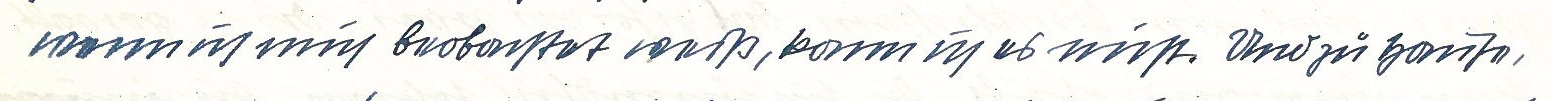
wenn ich mich beobachtet weiß, kann ich es nicht. Und zu Hause,
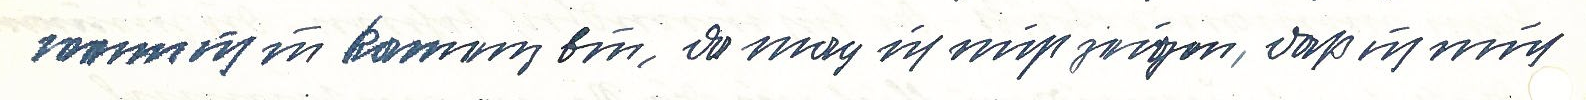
wenn ich in K. bin, da mag ich nicht zeigen, daß ich mich
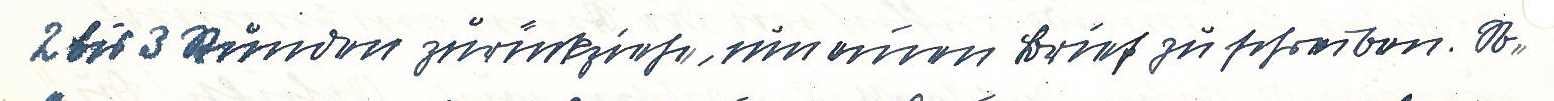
2 bis 3 Stunden zurückziehe, um einen Brief zu schreiben. So¬
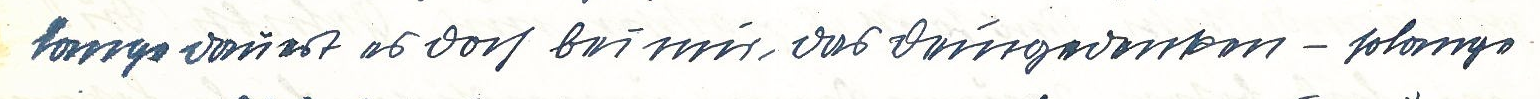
lange dauert es doch bei mir, das Deingedenken – solange
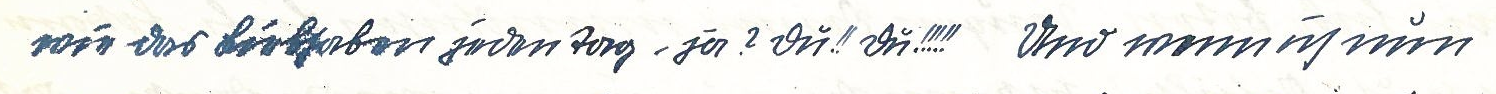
wie das Liebhaben jeden Tag, ja? Du!! Du!!!!! Und wenn ich nun
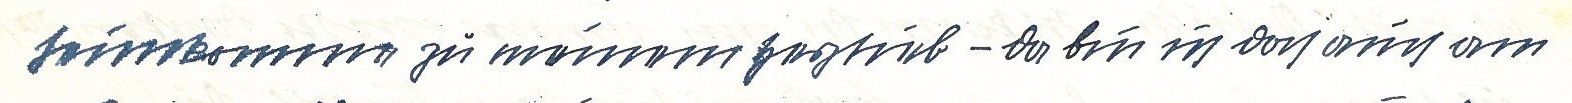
heimkomme zu meinem Herzlieb – da bin ich doch auch am
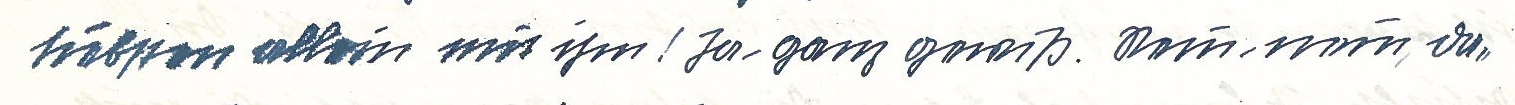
liebsten allein mit ihm! Ja – ganz gewiß. Nein, nein, da¬
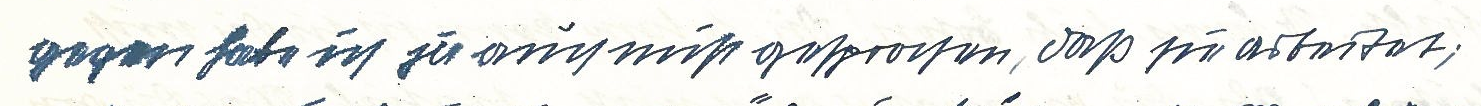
gegen habe ich ja auch nicht gesprochen, daß sie arbeitet;
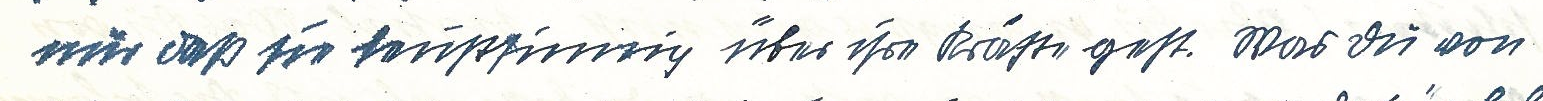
nur daß sie leichtsinnig über ihre Kräfte geht. Was Du von
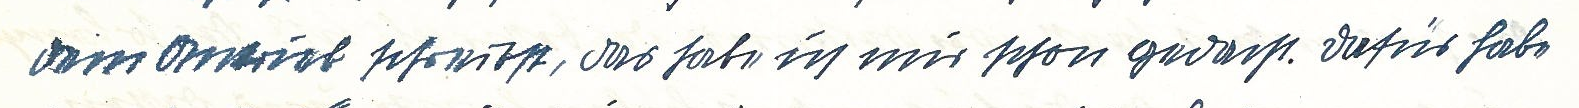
dem Antrieb schreibst, das habe ich mir schon gedacht. Dafür habe
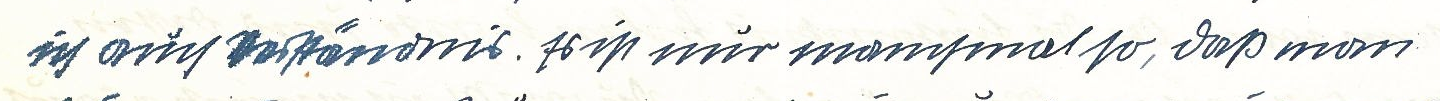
ich auch Verständnis. Es ist nur manchmal so, daß man
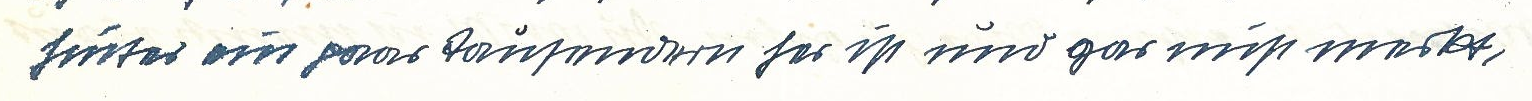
hinter ein paar Tausendern her ist und gar nicht merkt,
